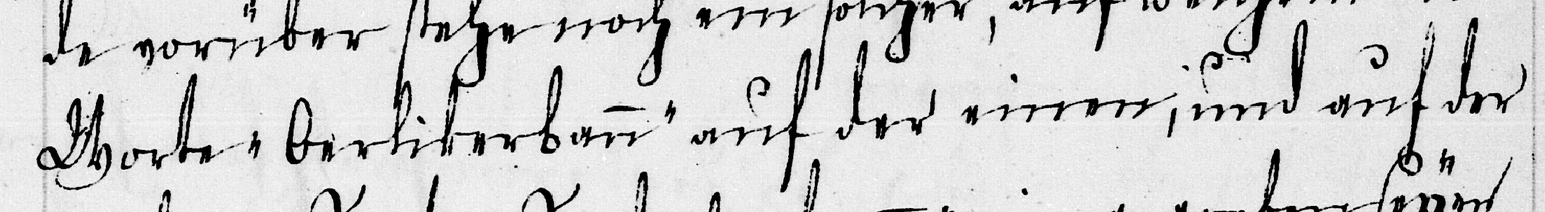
Worte „Oerlikerbann“ auf der einen, und auf der
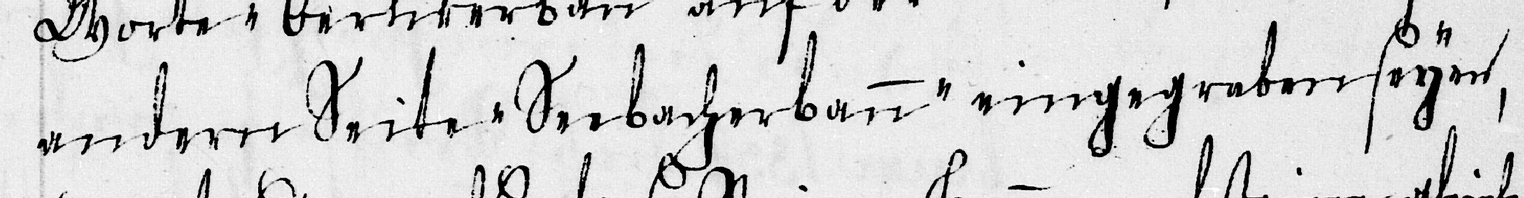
andern Seite „Seebacherbann“ eingegraben seyen,
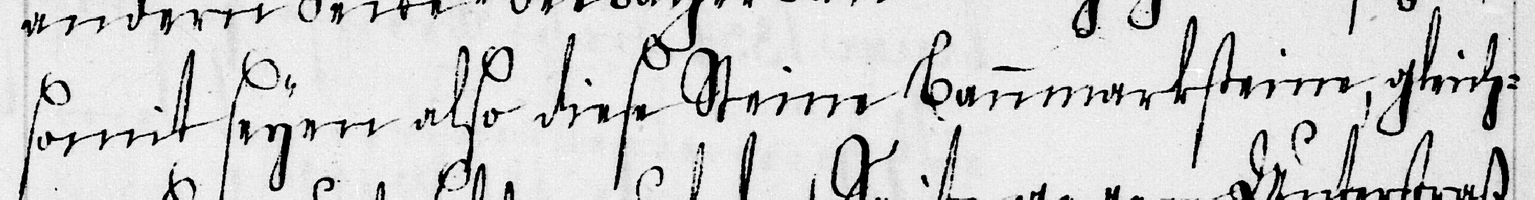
somit seyen also diese Steine Bannmarksteine, gleich¬
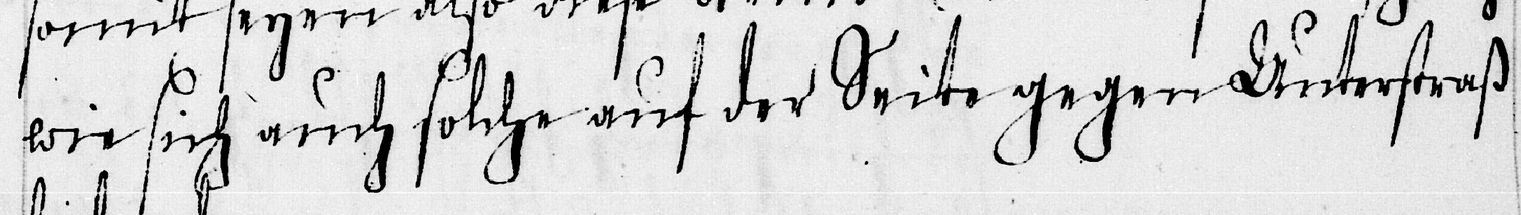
wie sich auch solche auf der Seite gegen Unterstraß
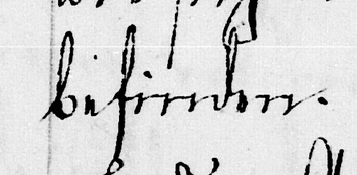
befinden.
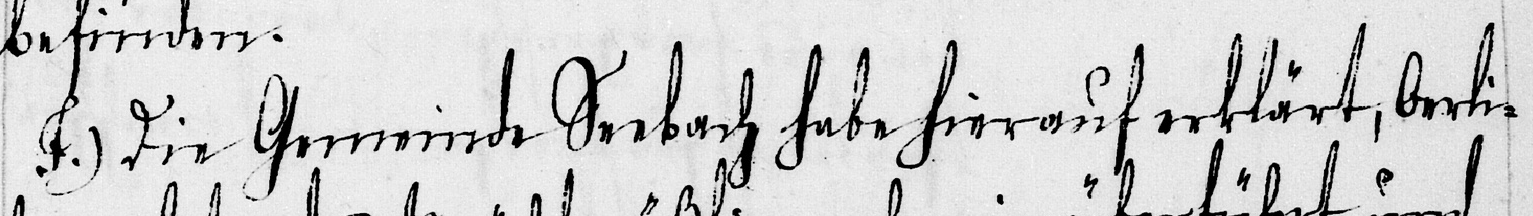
F.) Die Gemeinde Seebach habe hierauf erklärt, Oerli¬
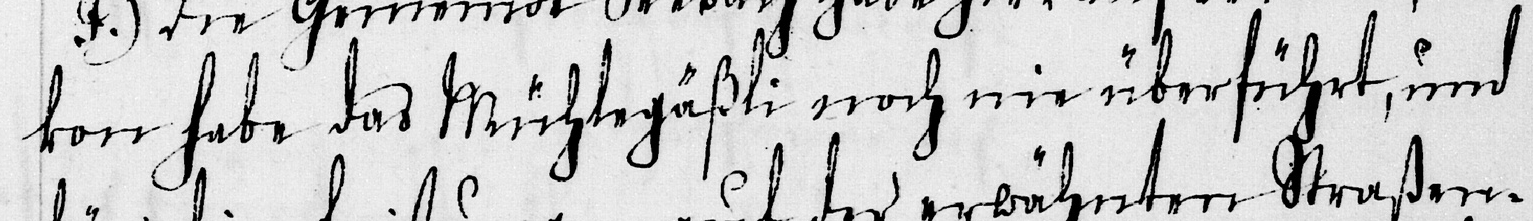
kon habe das Mühlegäßli noch nie überführt, und
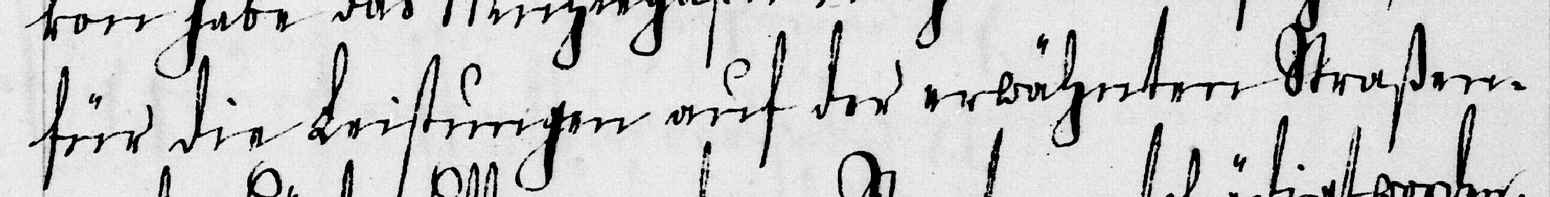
für die Leistungen auf der erwähnten Straßen¬
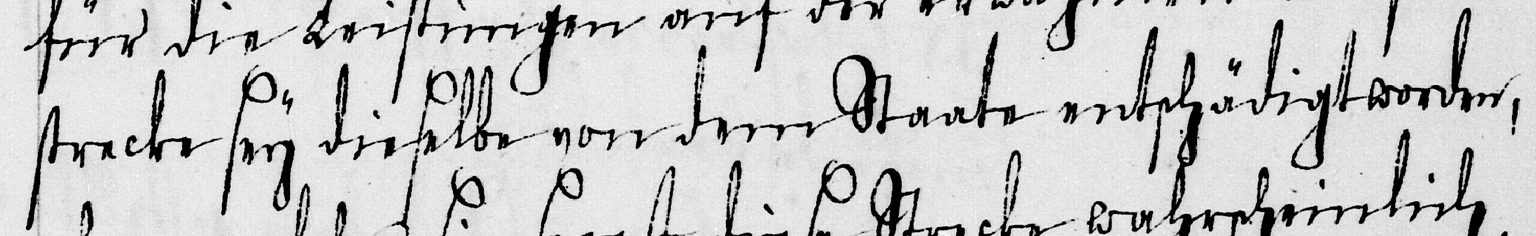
strecke sey dieselbe von dem Staate entschädigt worden,
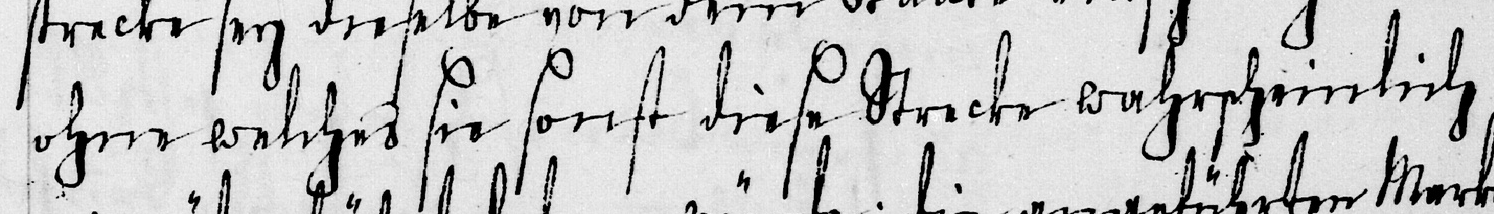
ohne welches sie sonst diese Strecke wahrscheinlich
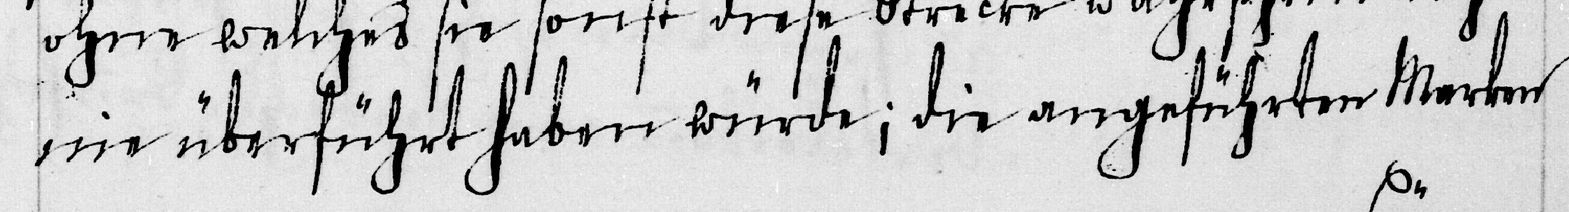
nie überführt haben würde; die angeführten Marken
